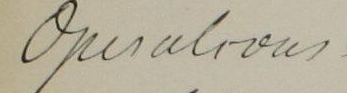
Operations-
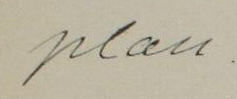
plan
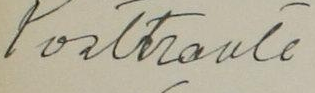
Posttrakte
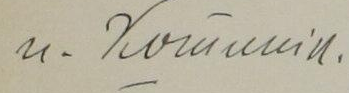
u. Kommunik.
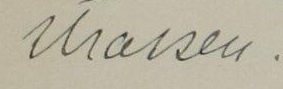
strassen
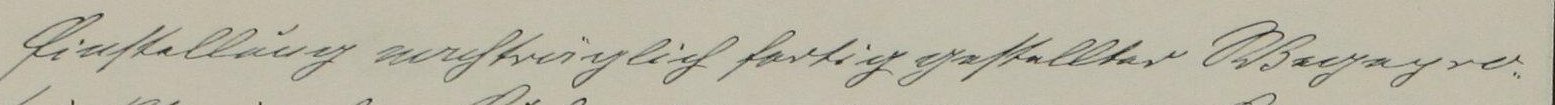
Einstellung nachträglich fertiggestellter Wegepro-
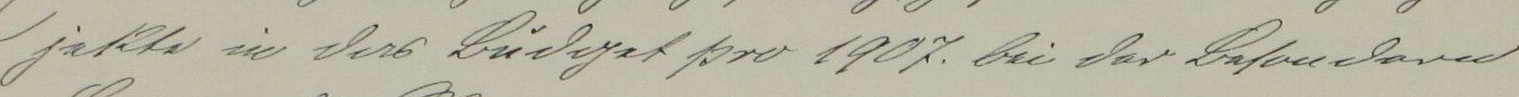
jekte in das Budget pro 1907. bei der Besonderen
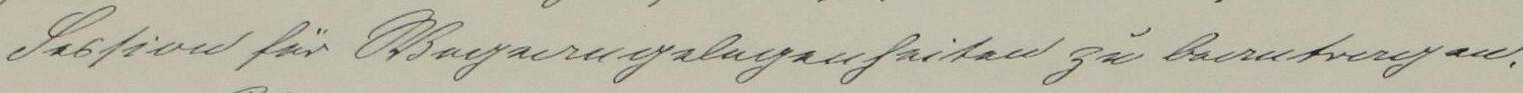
Session für Wegeangelegenheiten zu beantragen.
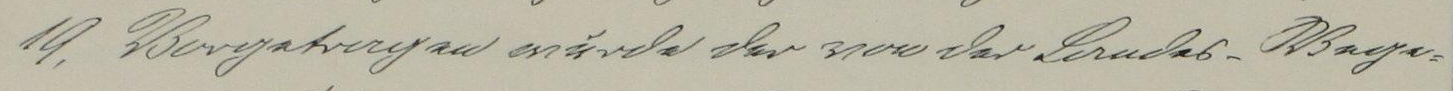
19. Vorgetragen wurde der von der Landes-Wege-
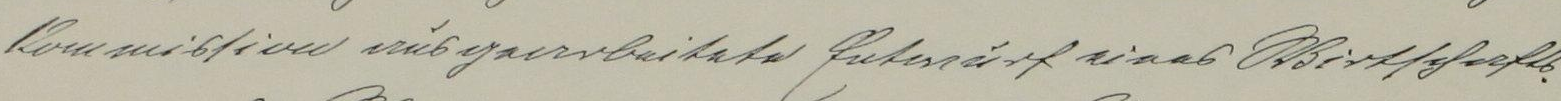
kommission ausgearbeitete Entwurf eines Wirtschafts-
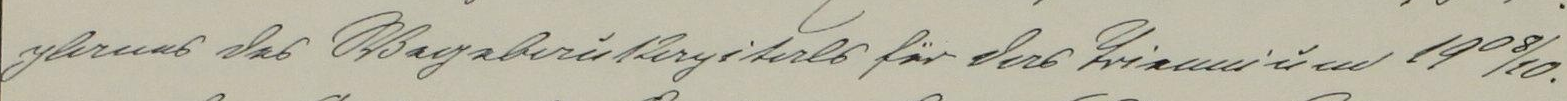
planes des Wegebaukapitals für das Triennium 1908/10.
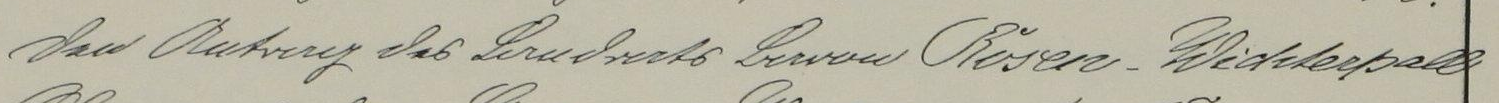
Den Antrag des Landrats Baron Rosen-Wichterpall
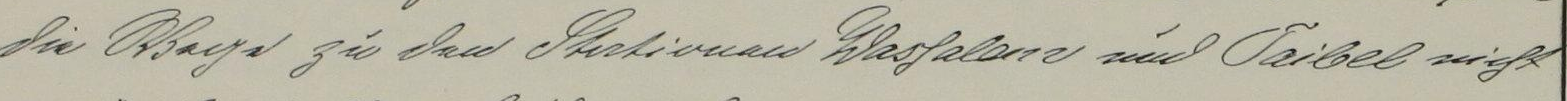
die Wege zu den Stationen Wassalem und Taibel nicht
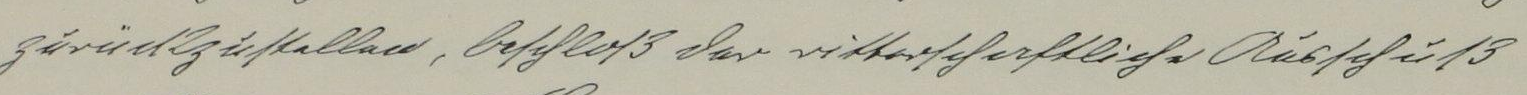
zurückzustellen, beschloß der ritterschaftliche Ausschuß
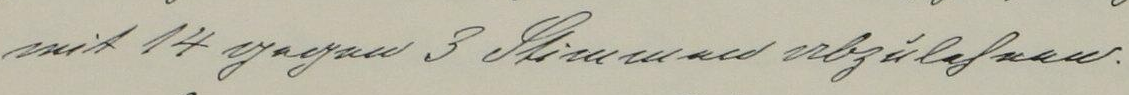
mit 14 gegen 3 Stimmen abzulehnen.
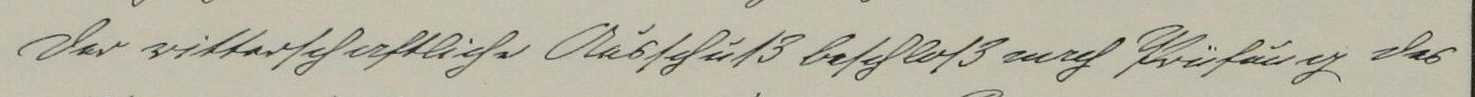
Der ritterschaftliche Ausschuß beschloß nach Prüfung des
